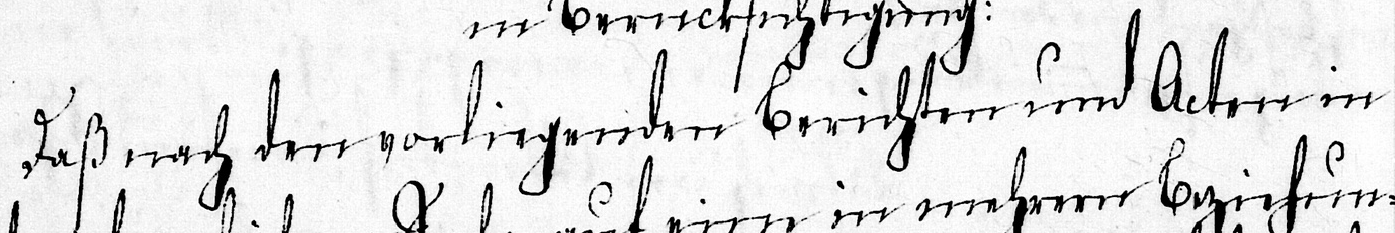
Daß nach den vorliegenden Berichten und Acten in
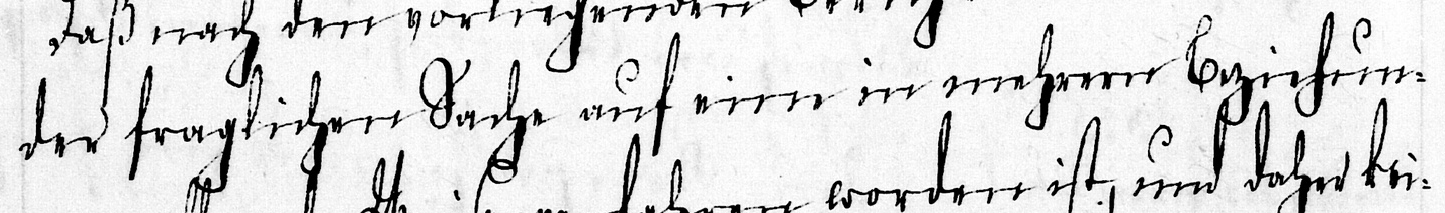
der fraglichen Sache auf eine in mehrern Beziehun¬
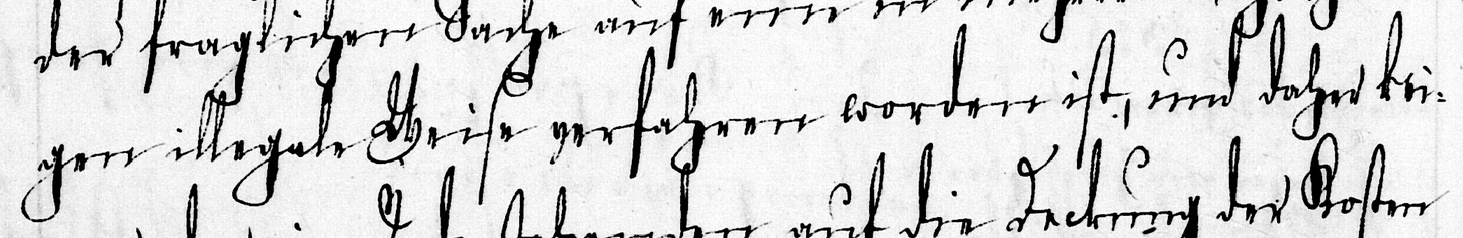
gen illegale Weise verfahren worden ist, und daher kei¬
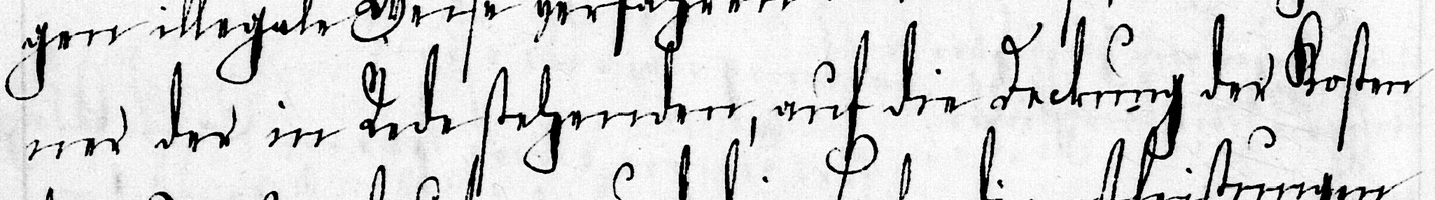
ner der in Rede stehenden, auf die Deckung der Kosten
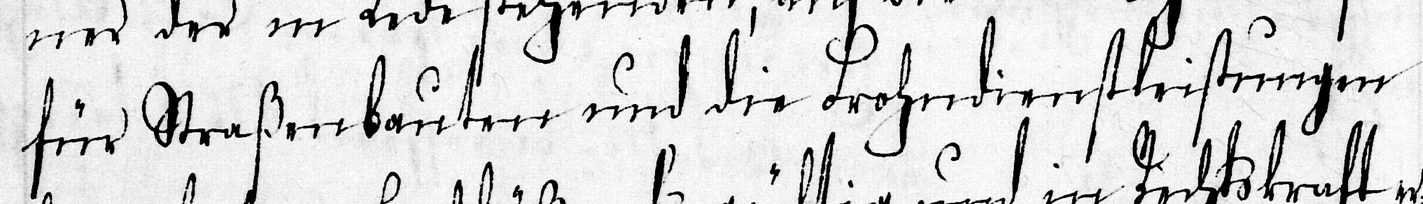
für Straßenbauten und die Frohndienstleistungen
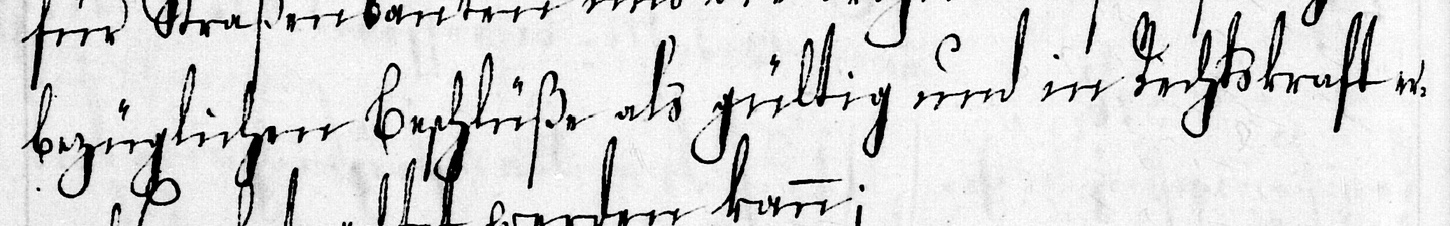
bezüglichen Beschlüße als gültig und in Rechtskraft e¬
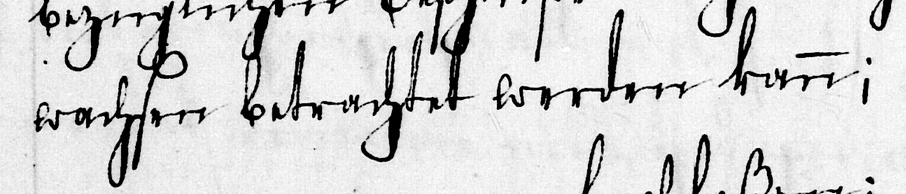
rwachsen betrachtet werden kann;
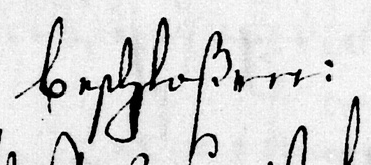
beschloßen:
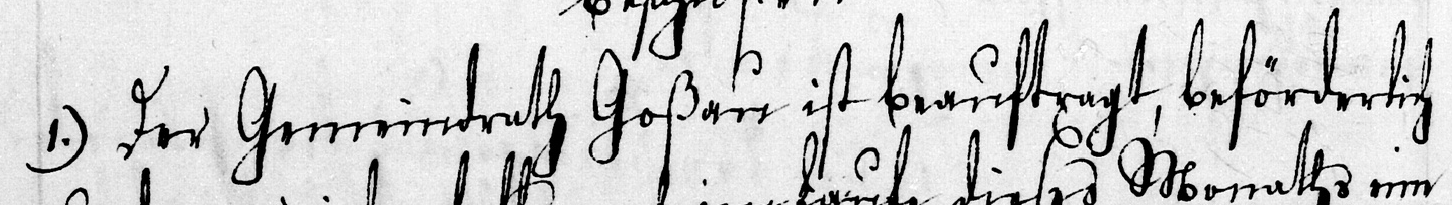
1.) Der Gemeindrath Goßau ist beauftragt, beförderlich
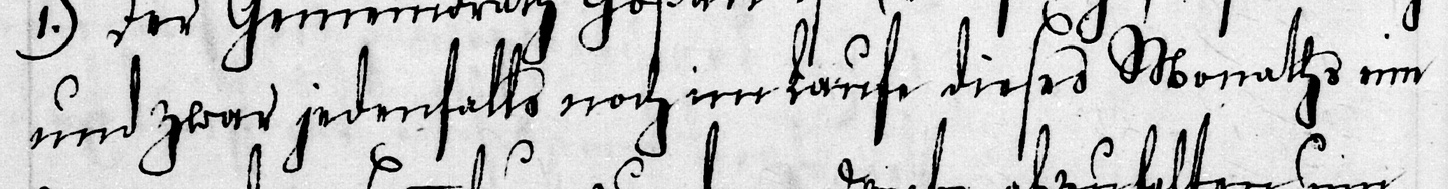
und zwar jedenfalls noch im Laufe dieses Monaths eine
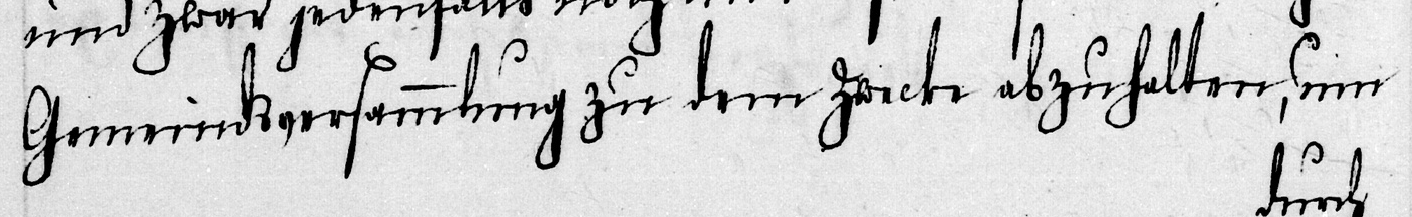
Gemeindsversammlung zu dem Zwecke abzuhalten, um
